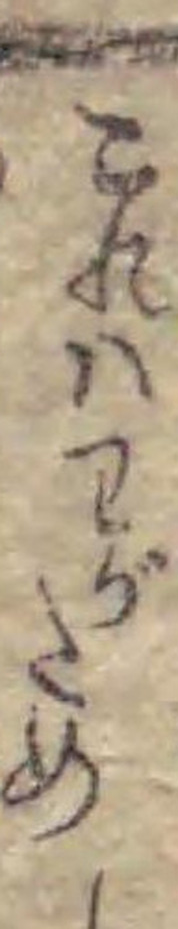これはわがため
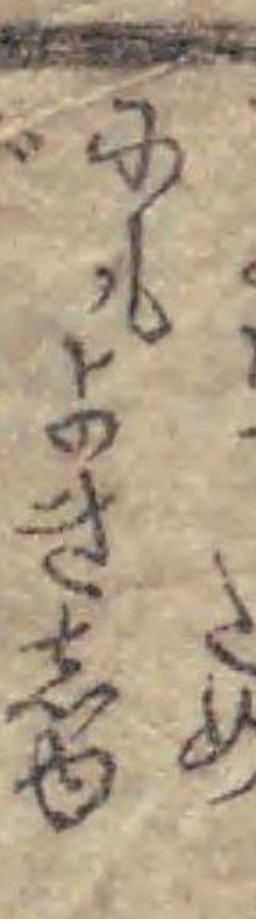にもよきしゆ
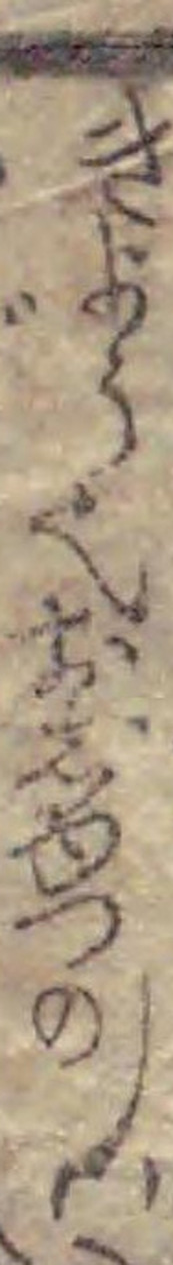ぎよう也おじゆつの
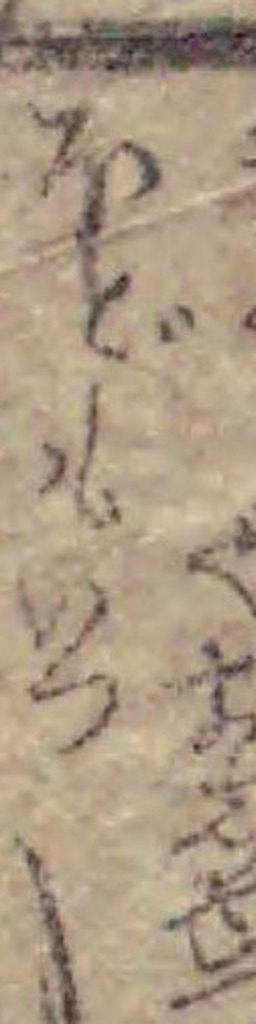ほどもいつ
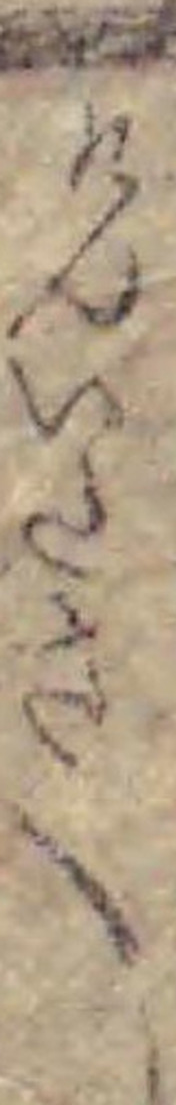けんいたさ
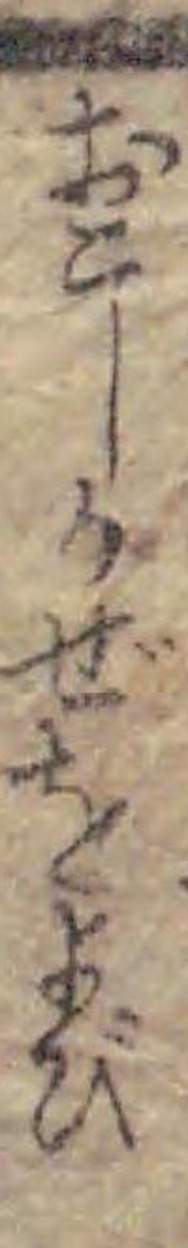おこしかぜをよび
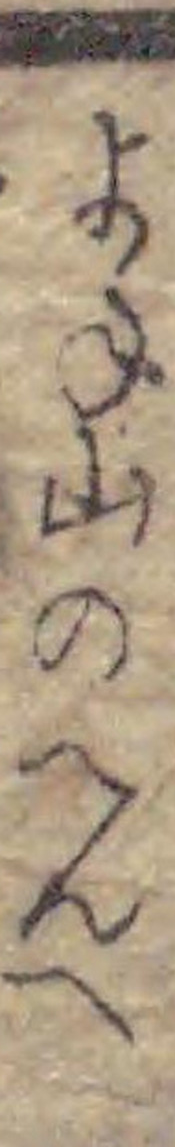よね山のへんへ
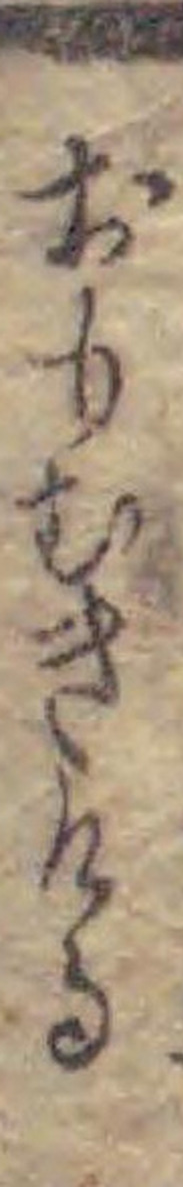おもむきける

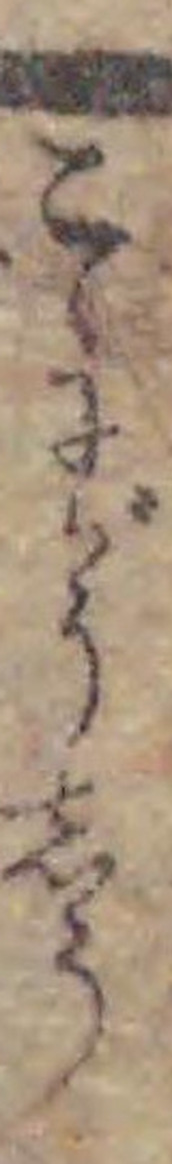こゝにがうしう
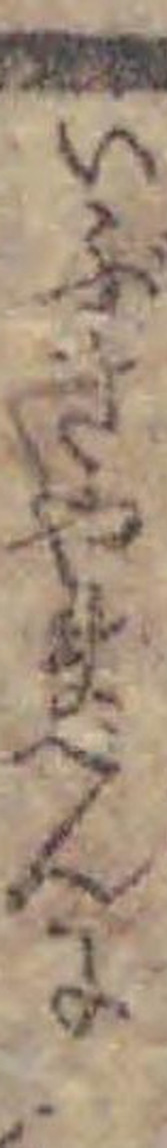いぶきやまへんに
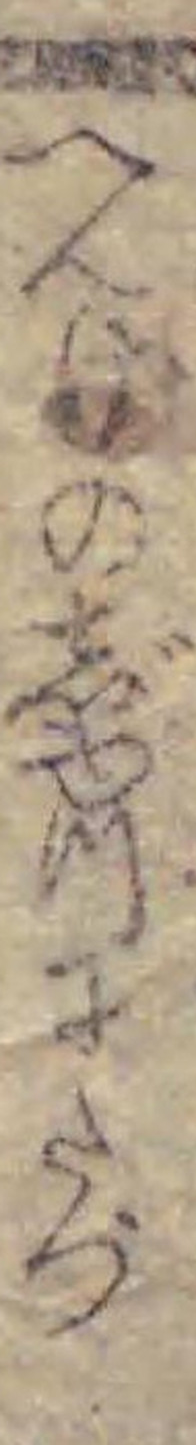へんげのじゆつにたつ
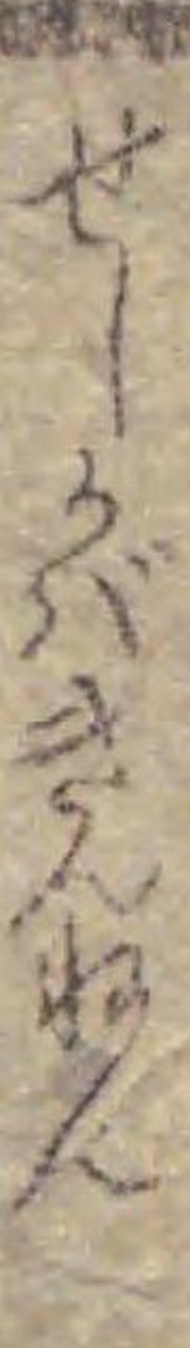せしかばきんねん
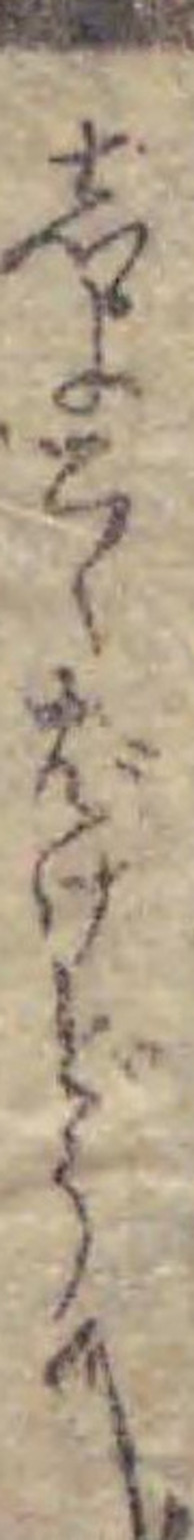しよこくばけどう
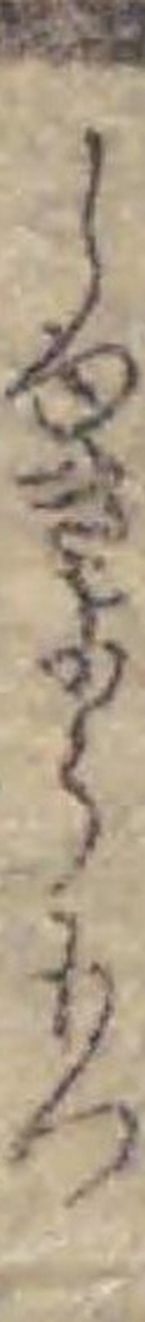しゆぎようもつ
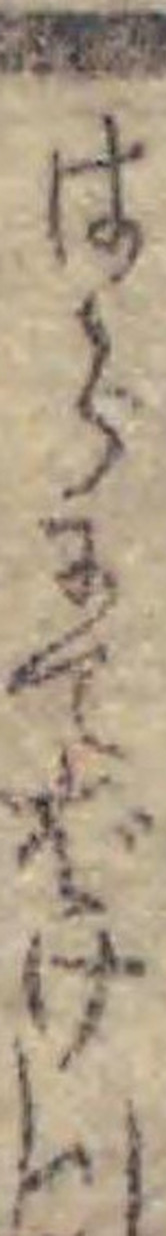はらにてばけ
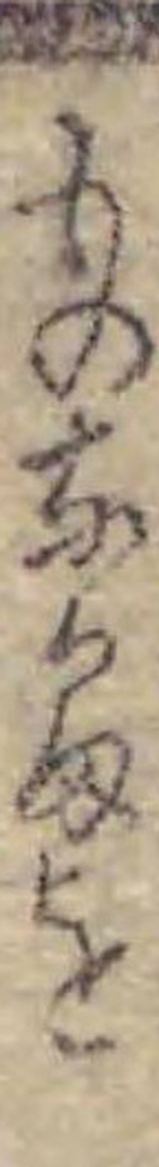ものなかまを
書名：化物世界夜半嵐 : 3巻
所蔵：国立国会図書館 National Diet Library, JAPAN
